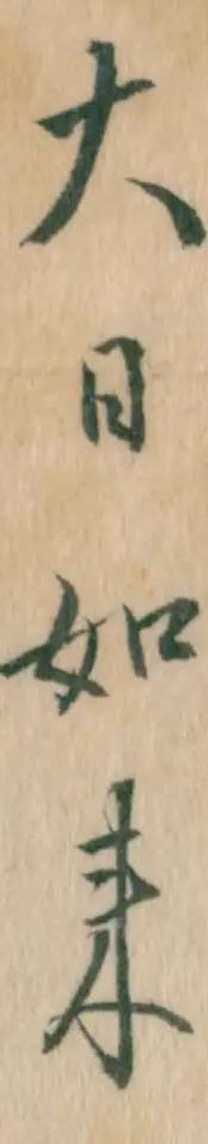大日如来
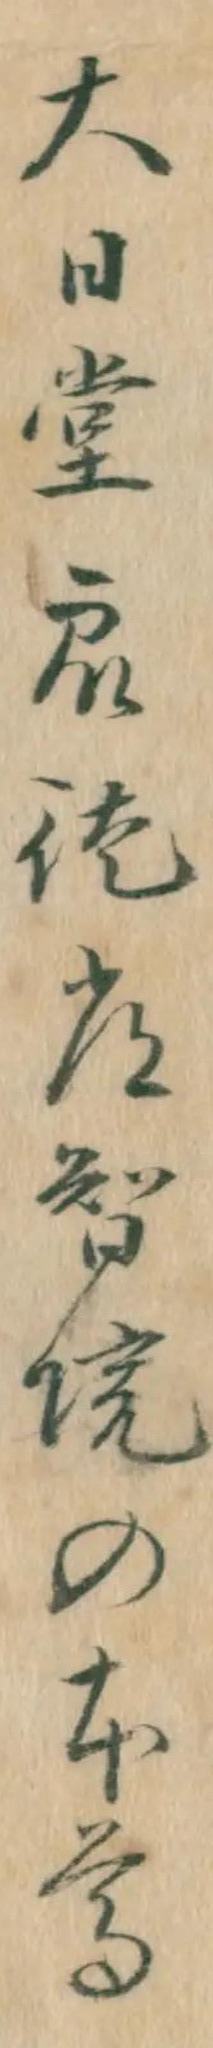大日堂衆徒常智院の本尊
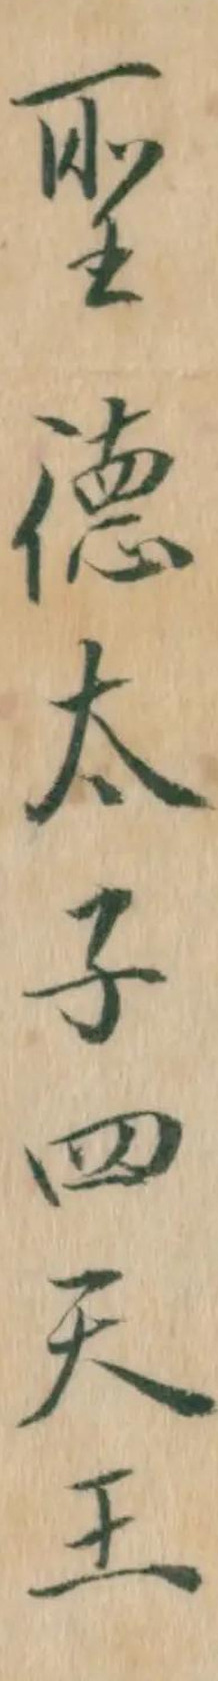聖徳太子四天王
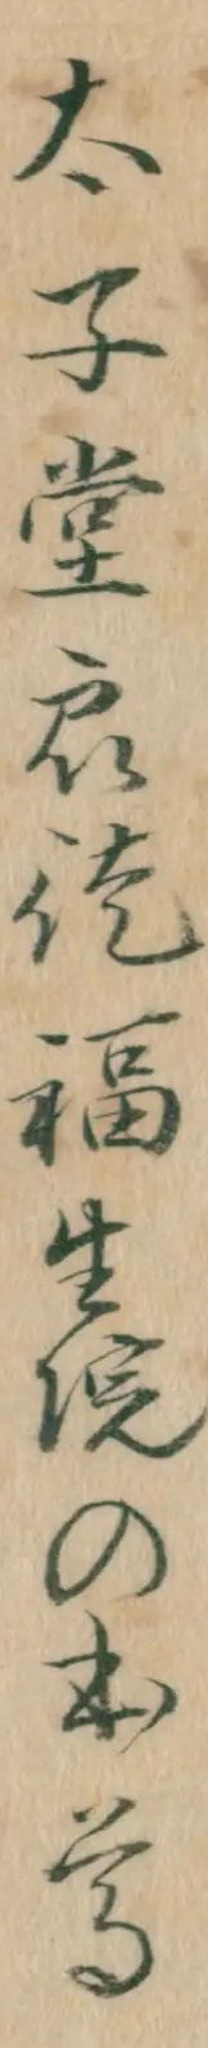太子堂衆徒福生院の本尊
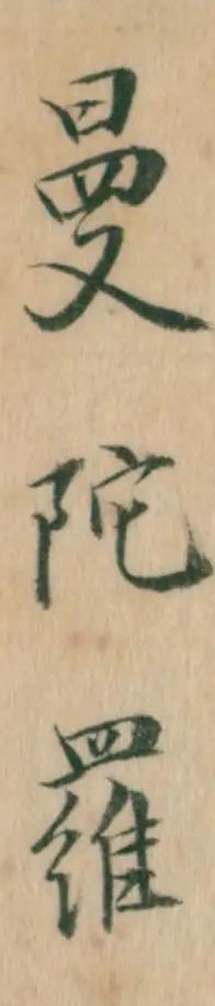曼陀羅
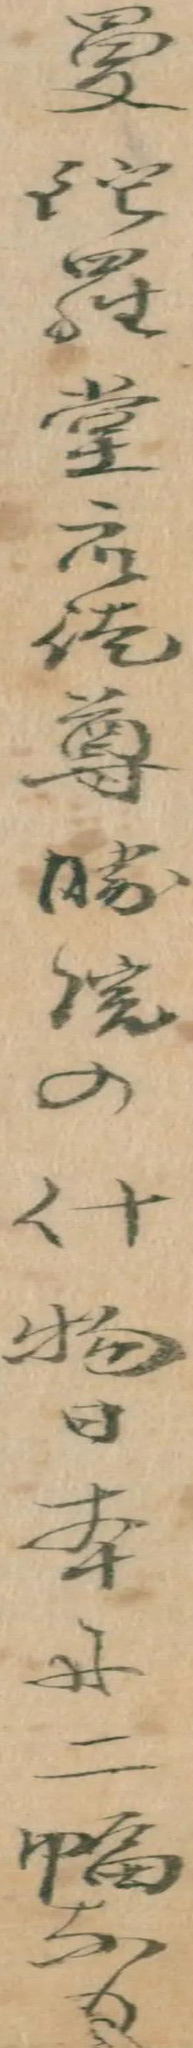曼陀羅堂衆徒尊勝院の什物日本に二幅な
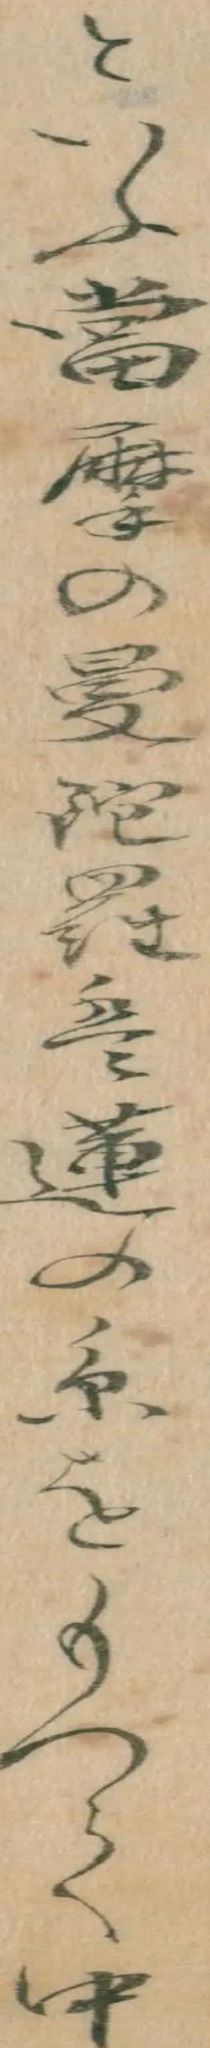といふ當摩の曼陀羅は蓮の糸をもつて中
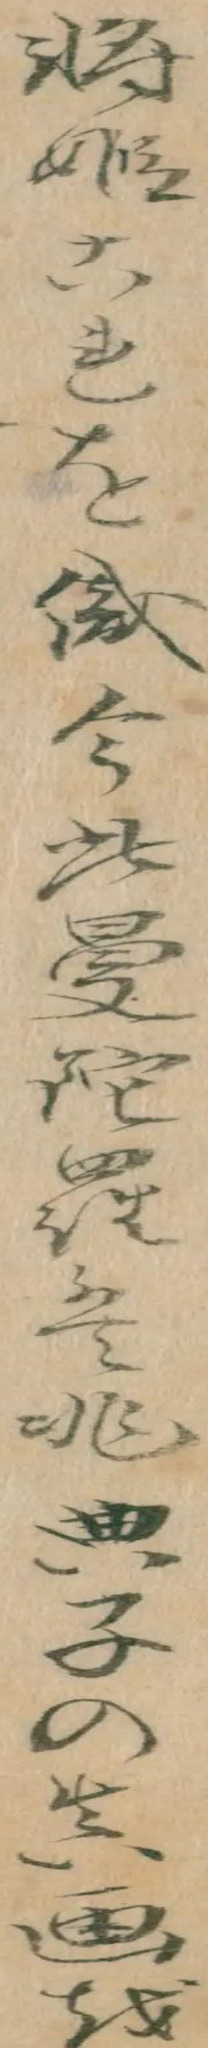将姫これを織今此曼陀羅は兆典子の真画を
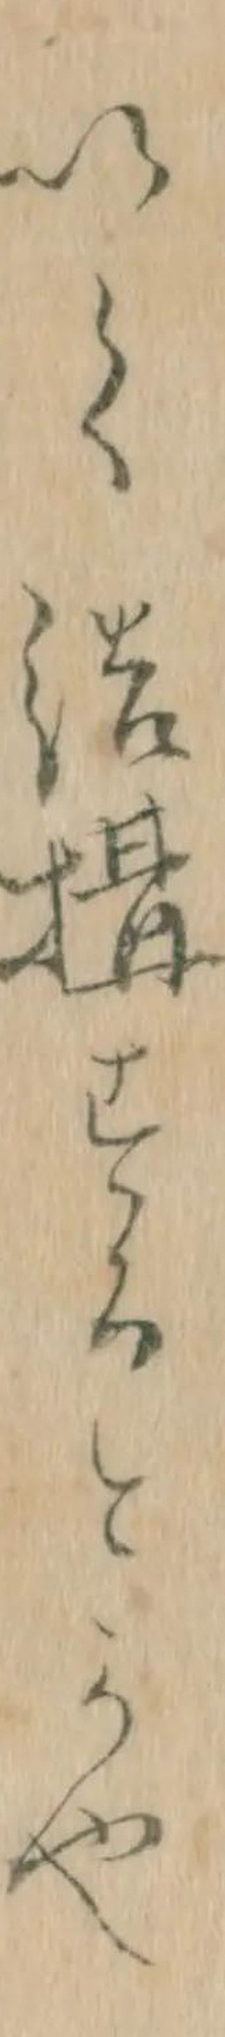以て結構するとかや
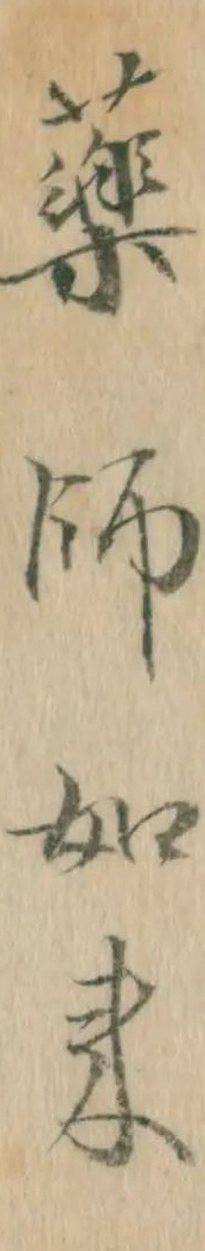薬師如来
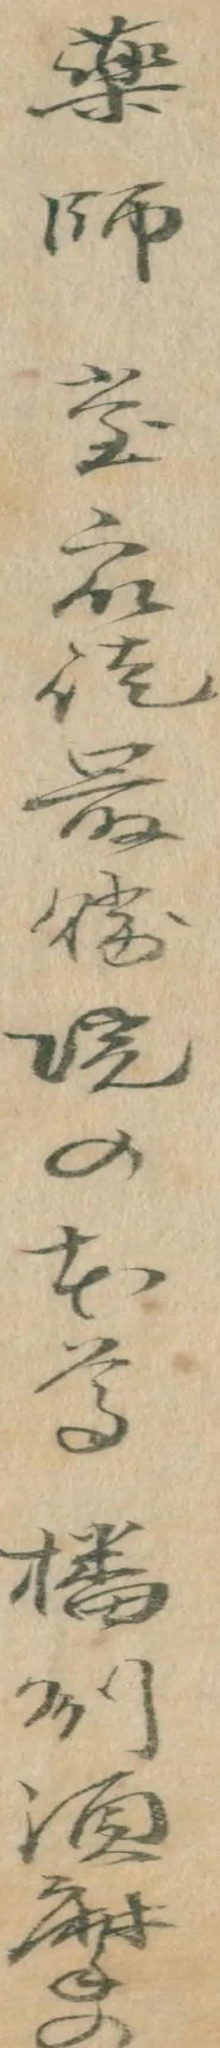薬師堂衆徒最勝院の本尊播州須摩の
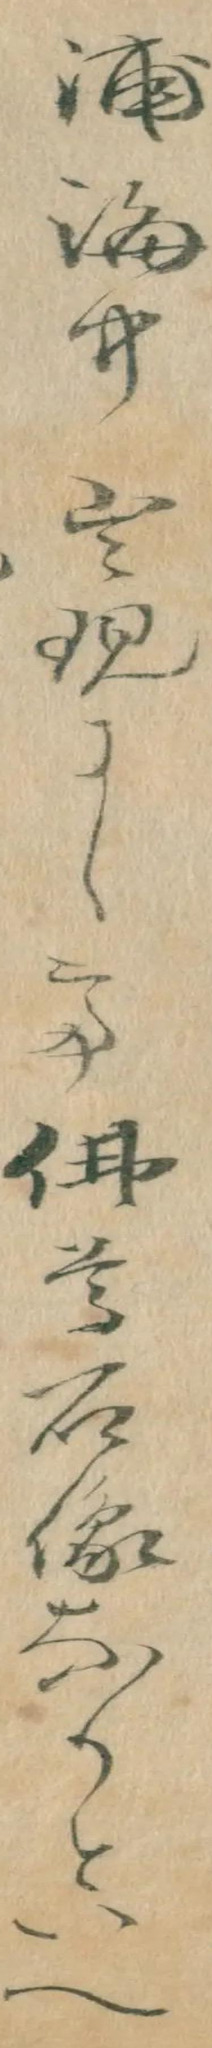浦海中出現にして佛尊石像なりといへ
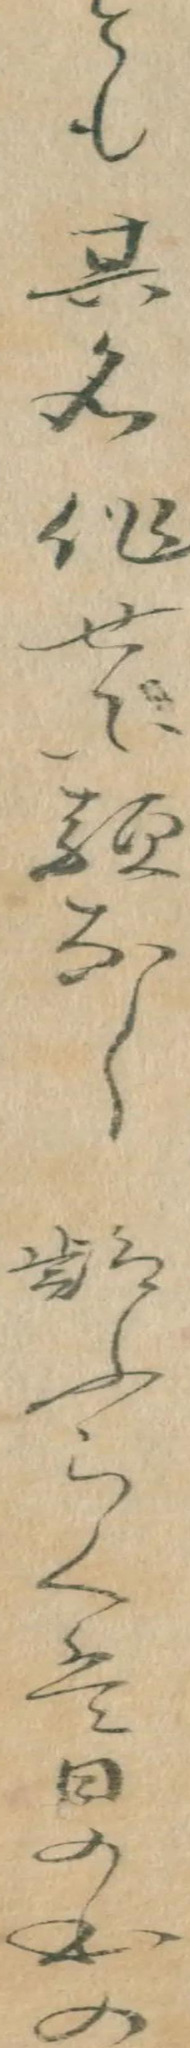とも其名作世に類なし疑ふらくは日の本の
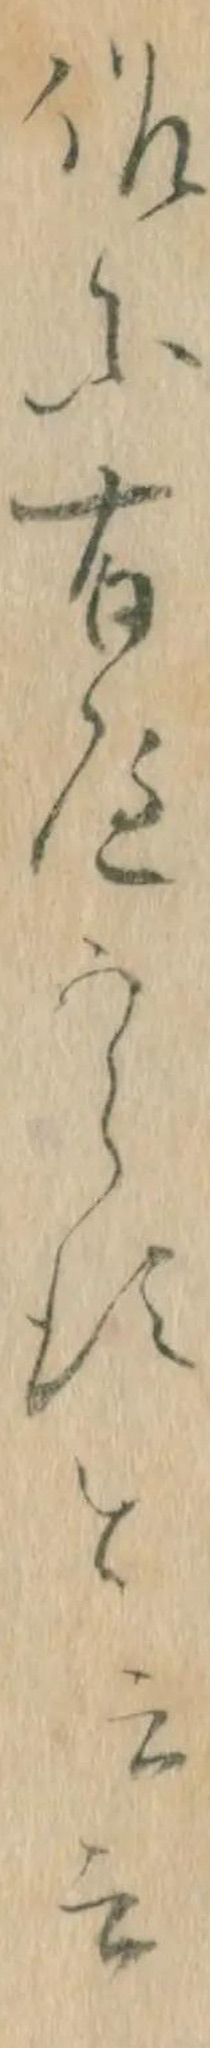作に有へからすと云云
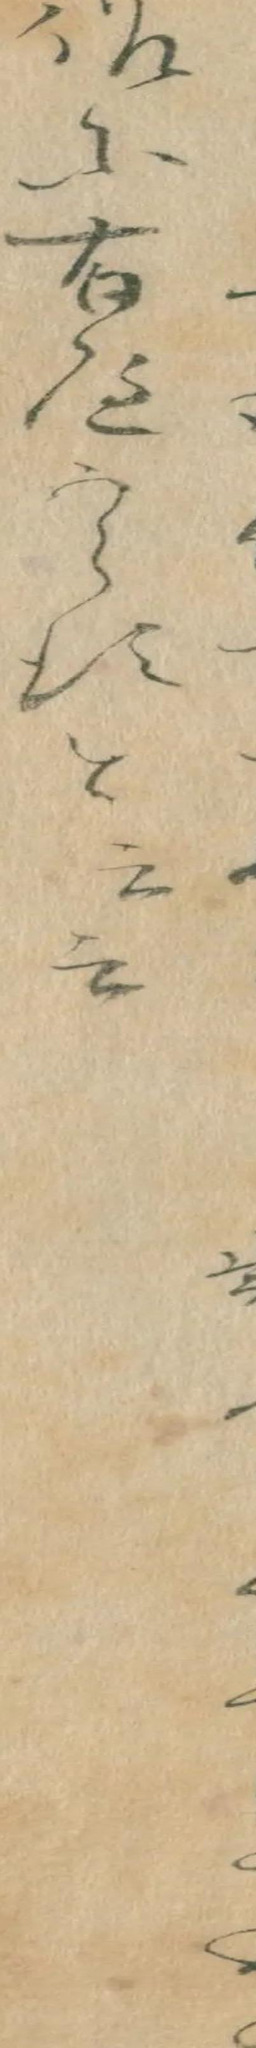作に有へからすと云云

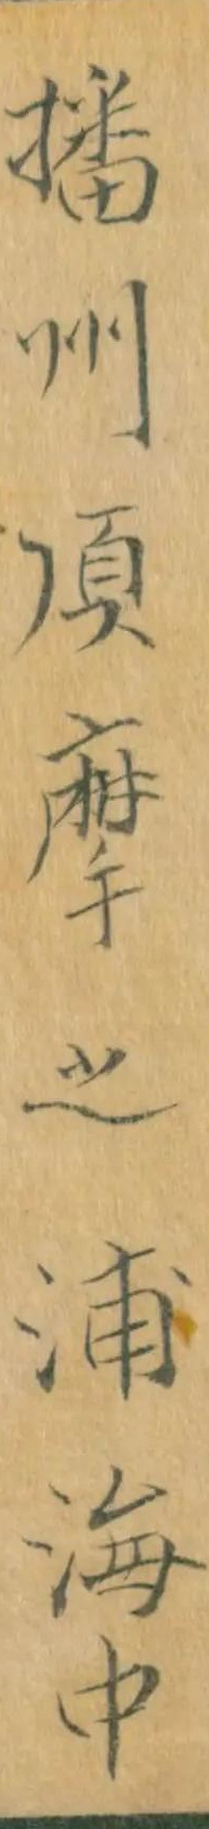播州須磨之浦海中
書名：俗語之種. [7]
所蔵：国立国会図書館 National Diet Library, JAPAN
